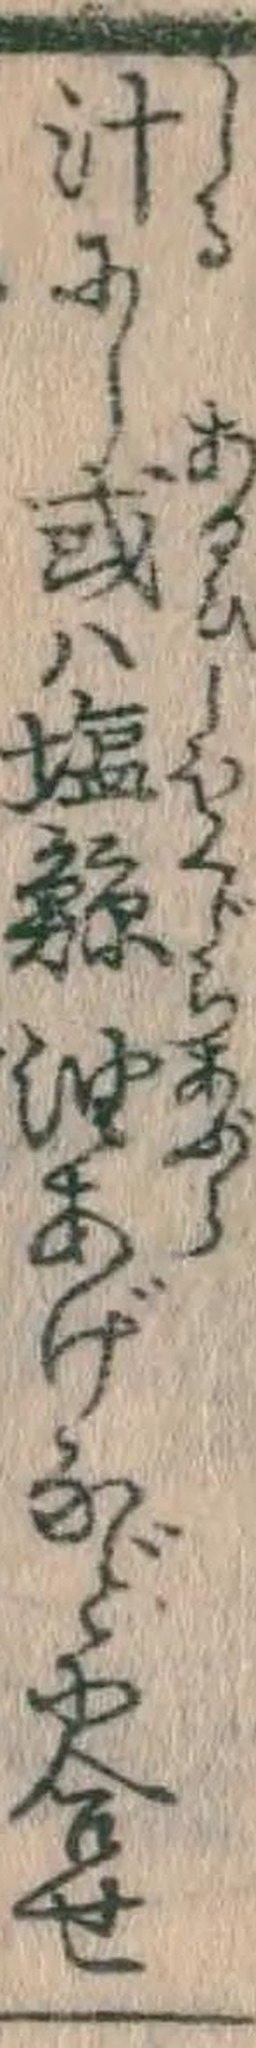汁にし或は塩鯨油あげなどに合せ
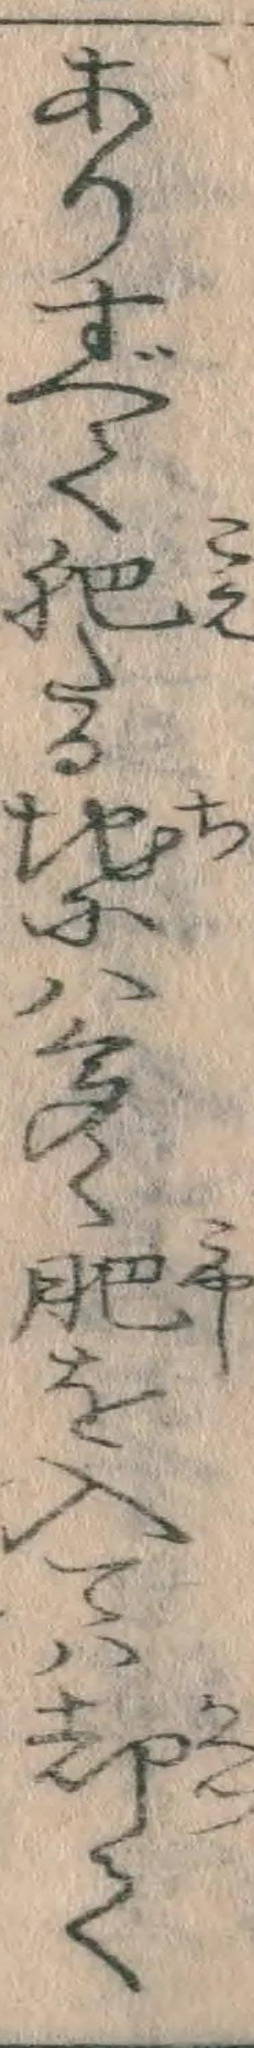ありすべて肥たる地には多く肥を入ては却て
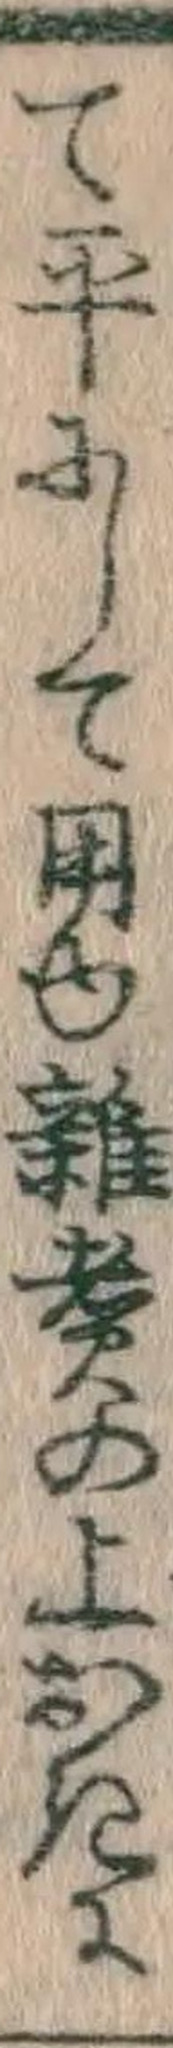て平にして用ゆ雑煮の上おきに
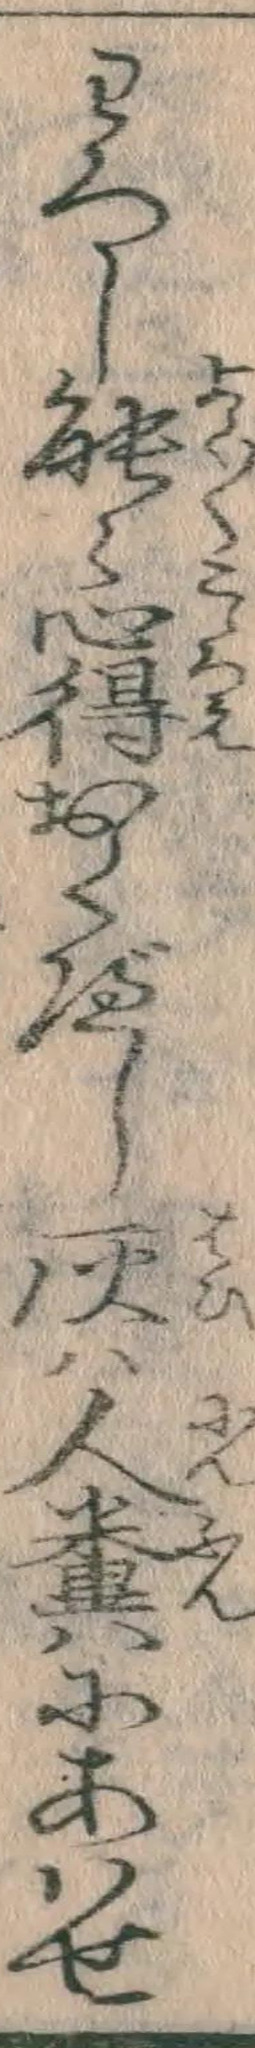わろし能々心得おくべし灰は人糞にあはせ
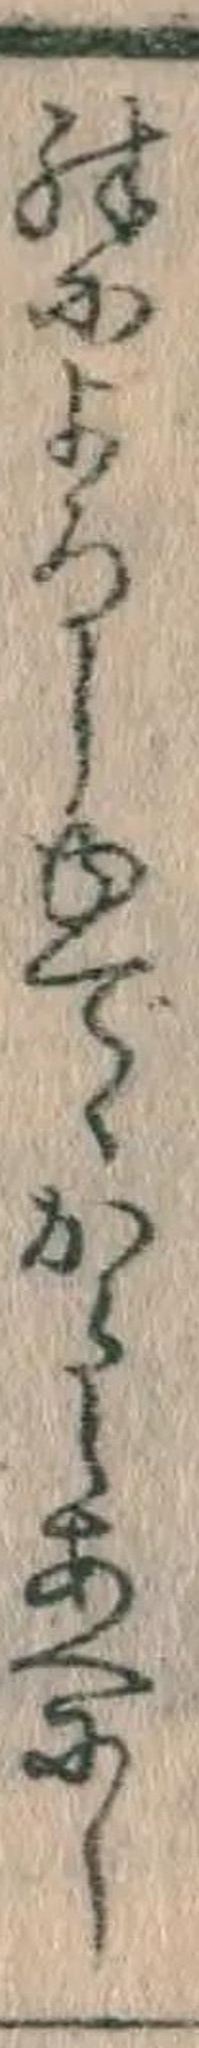殊によろしゆでゝからしあへにし
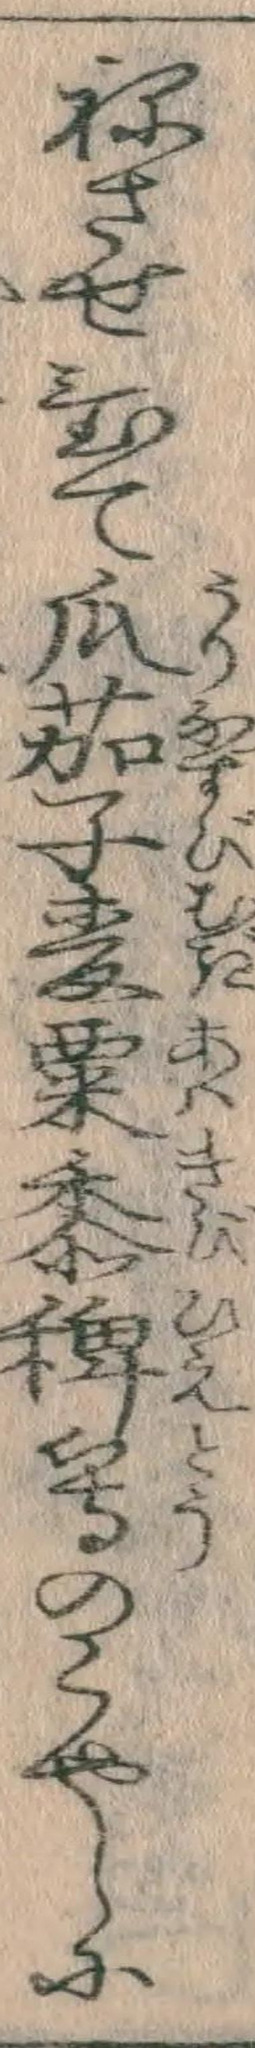ねさせ置て瓜茄子麦粟黍稗等のこやしに
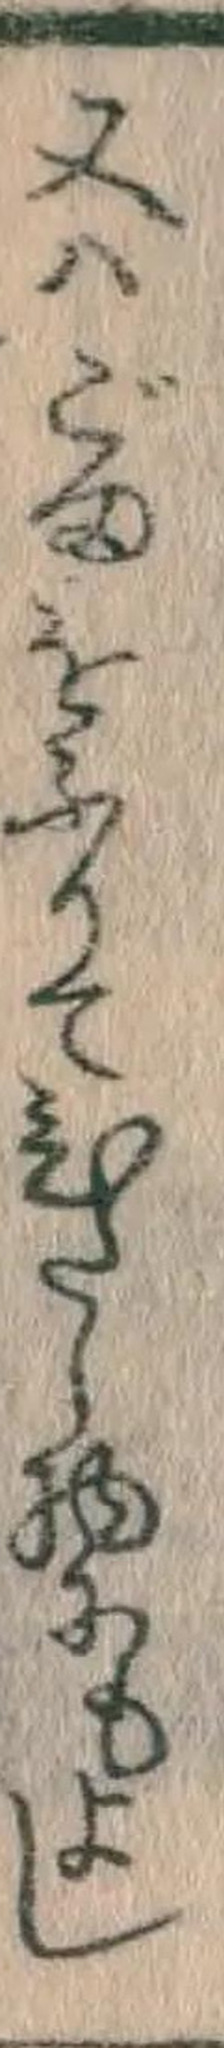又はごまをふりてひたし物にもよし
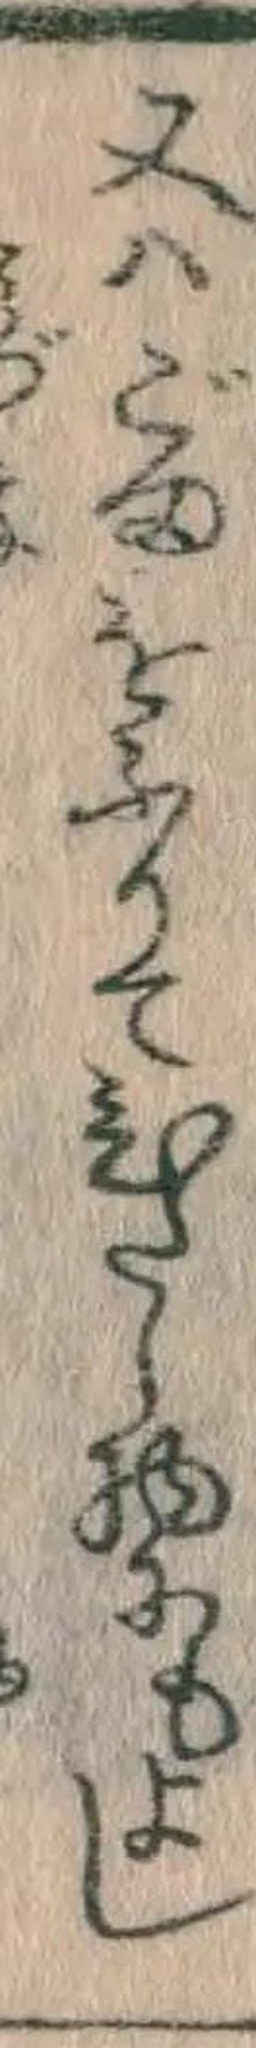又はごまをふりてひたし物にもよし
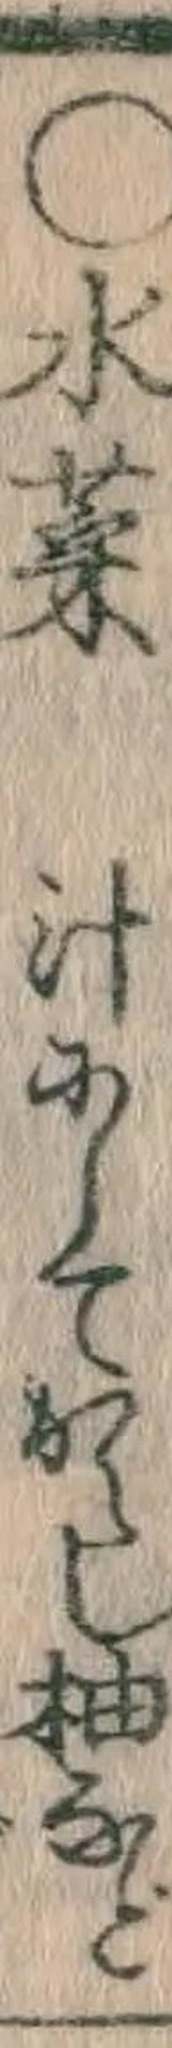○水菜汁にしてからし柚など
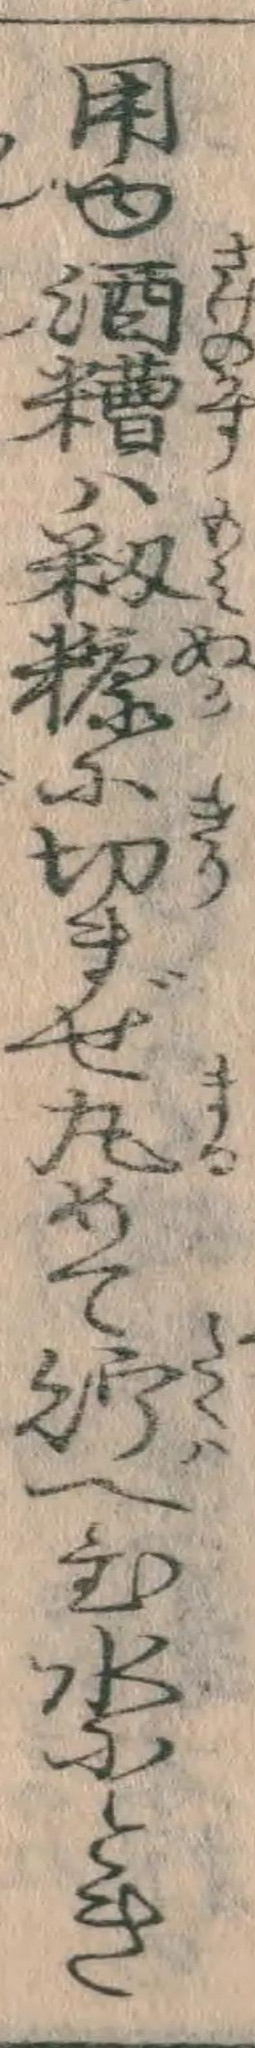用ゆ酒糟は籾糠に切まぜ丸めて貯へ置水にとき
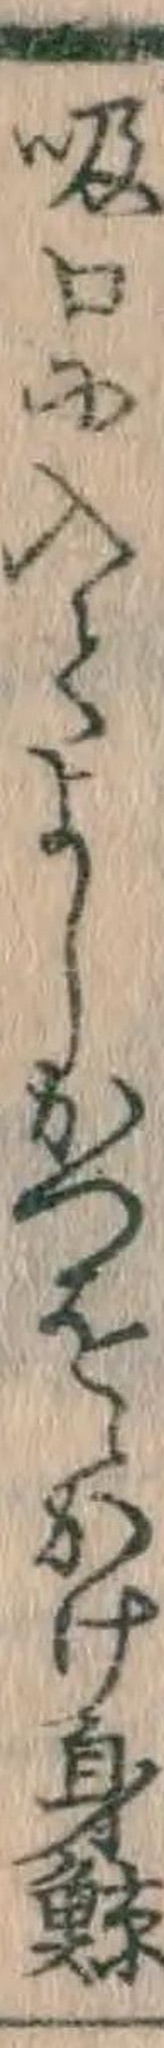吸口に入てよしかつをゝかけ身鯨
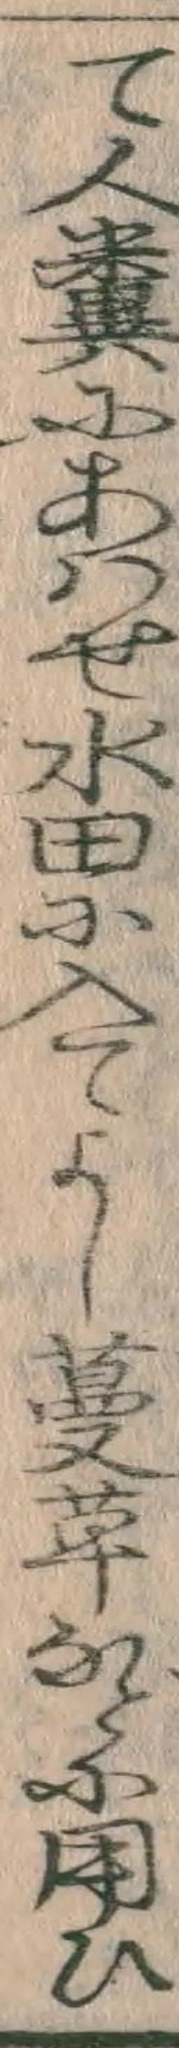て人糞にあはせ水田に入てよし蔓草などに用ひ
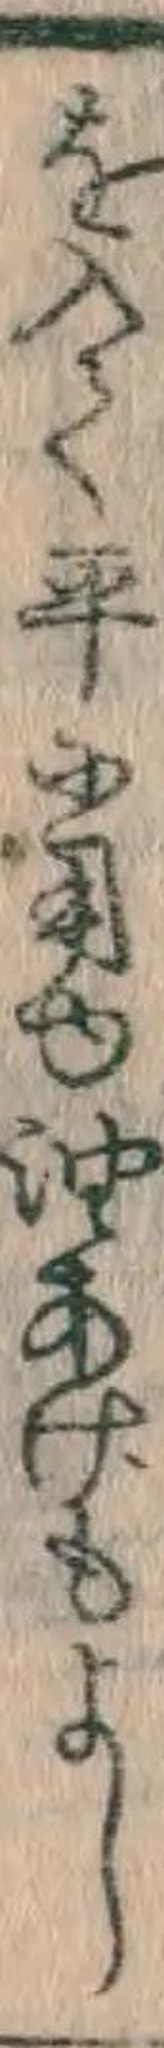を入て平に用ゆ油あけもよし
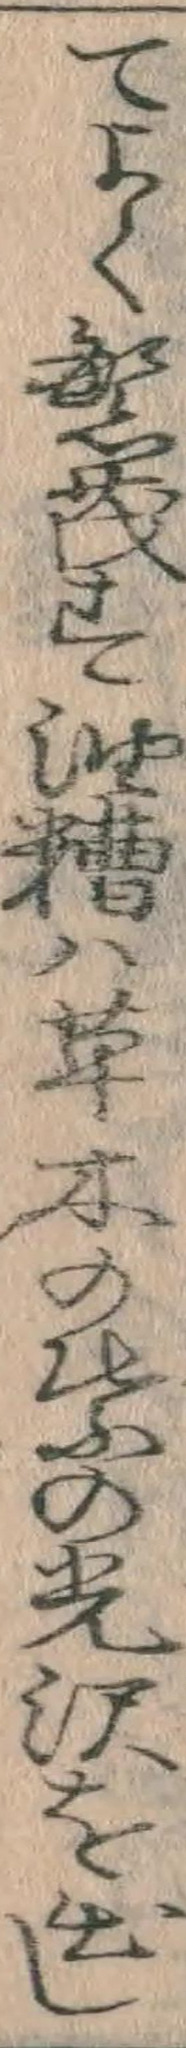てよく繁茂す油糟は草木の葉の光沢を出し
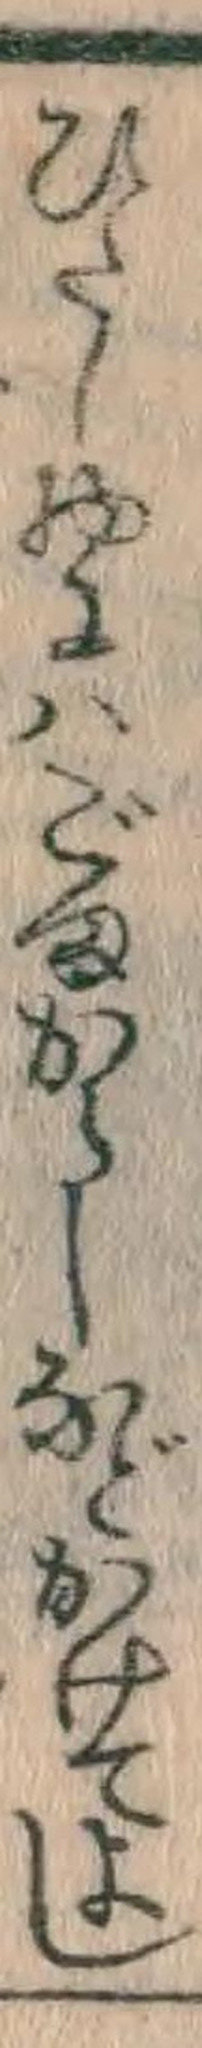ひたし物にはごまからしなどかけてよし
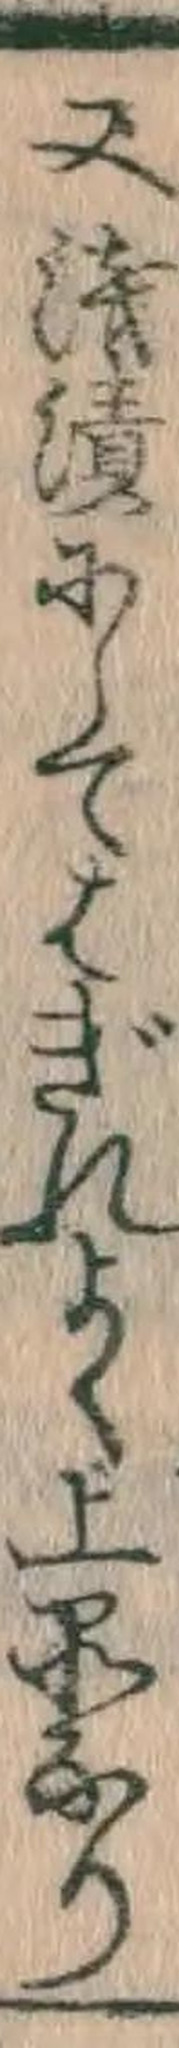又浅漬にしてはぎれよく上品なり
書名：広益秘事大全 3巻. [5]
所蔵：国立国会図書館 National Diet Library, JAPAN
